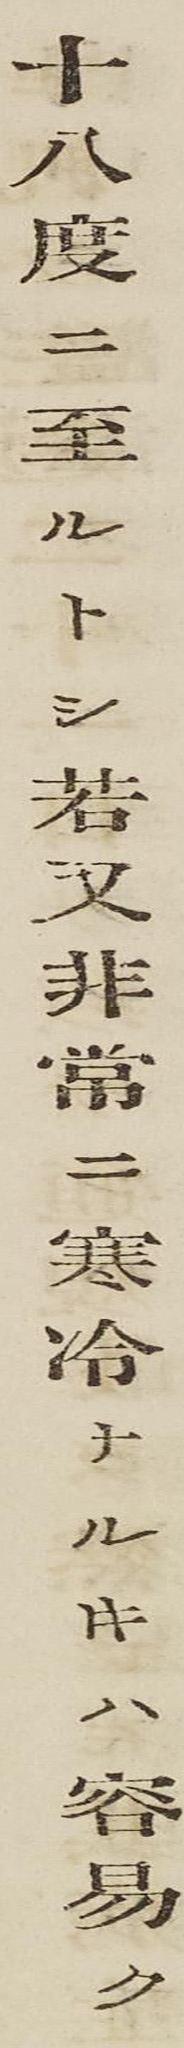十八度ニ至ルトシ若又非常ニ寒冷ナルトキハ容易ク
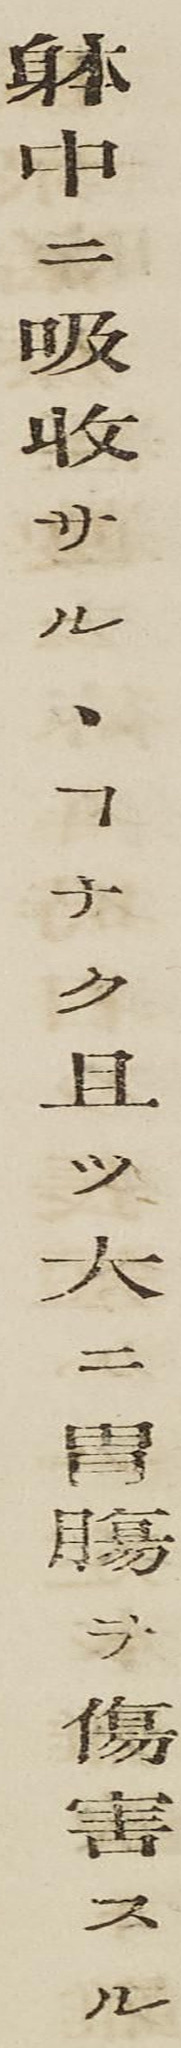体中ニ吸収サルヽコトナク且ツ大ニ胃腸ヲ傷害スル
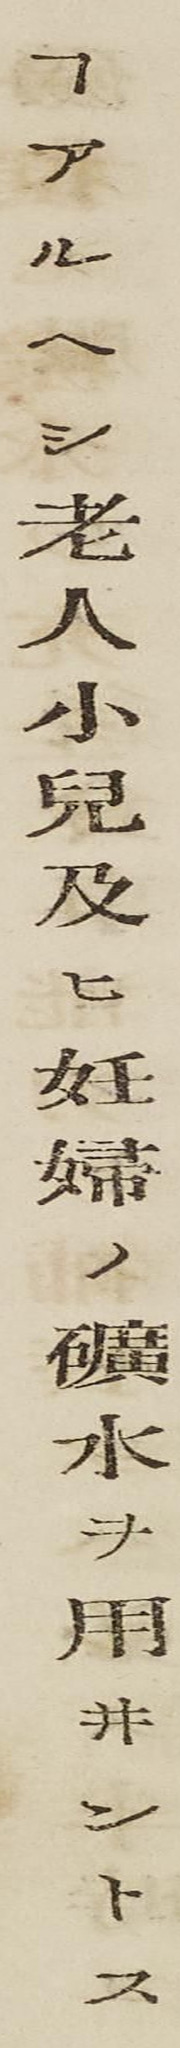コトアルヘシ老人小児及ヒ妊婦ノ礦水ヲ用ヰントス
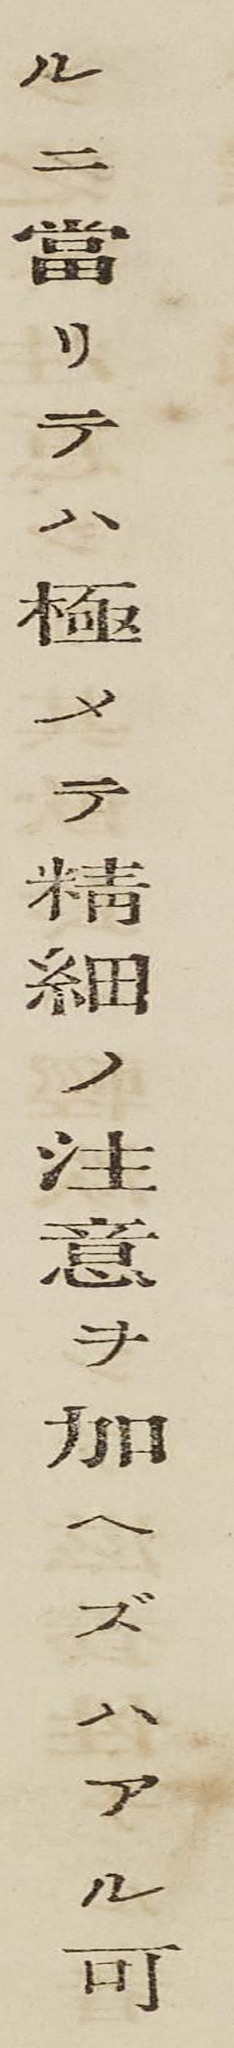ルニ当リテハ極メテ精細ノ注意ヲ加ヘズハアル可
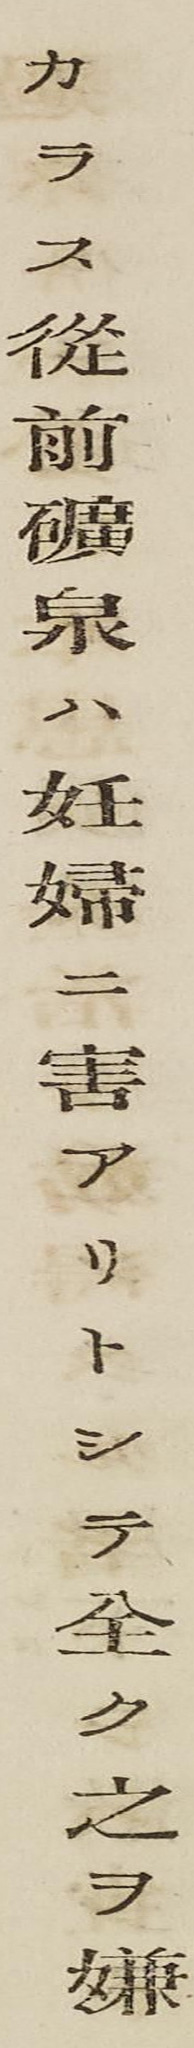カラス従前礦泉ハ妊婦ニ害アリトシテ全ク之ヲ嫌
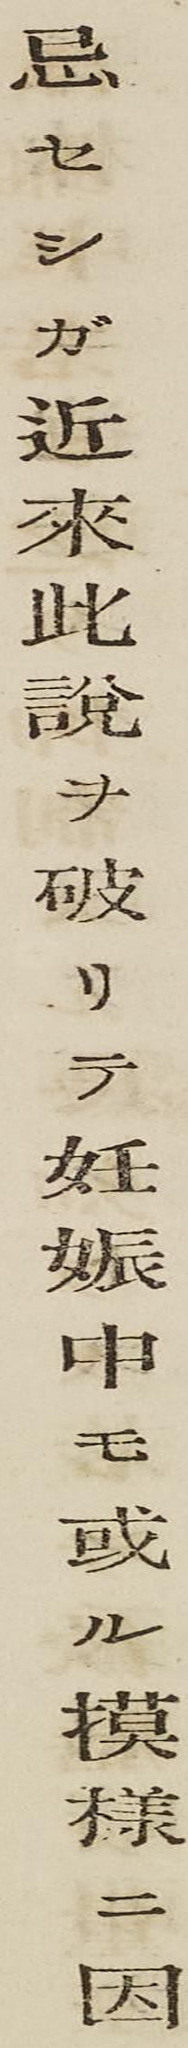忌セシガ近来此説ヲ破リテ妊婦中モ或ル模様ニ因
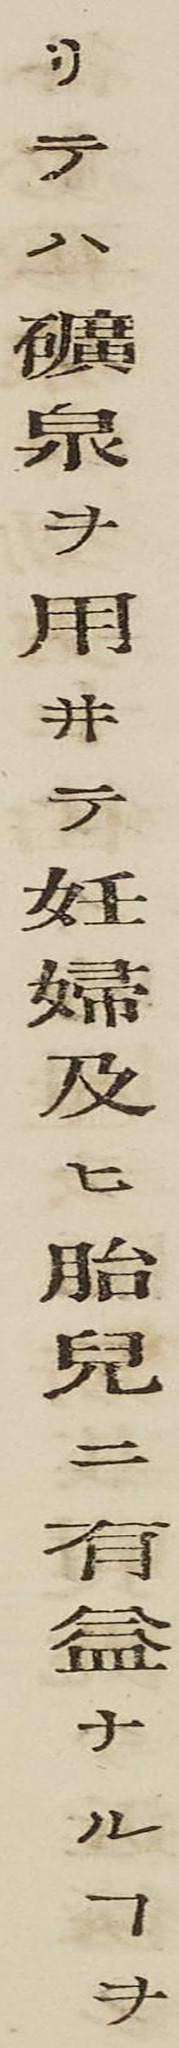リテハ礦泉ヲ用ヰテ妊婦及ヒ胎児ニ有益ナルコトヲ
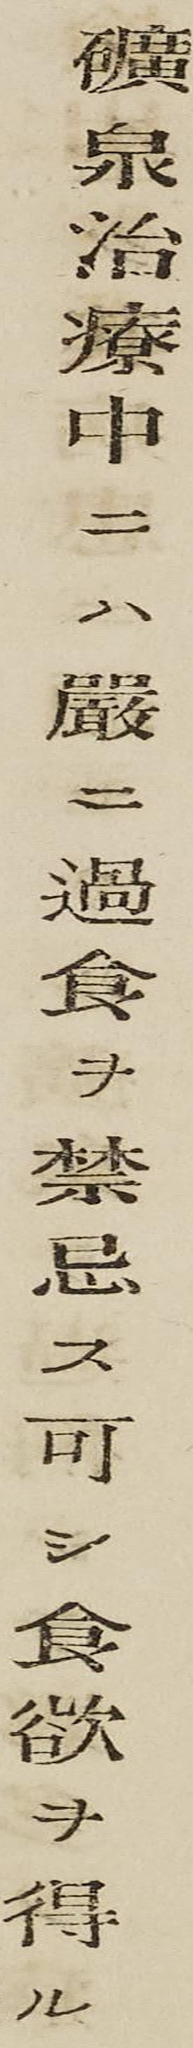礦泉治療中ニハ厳ニ過食ヲ禁忌ス可シ食欲ヲ得ル
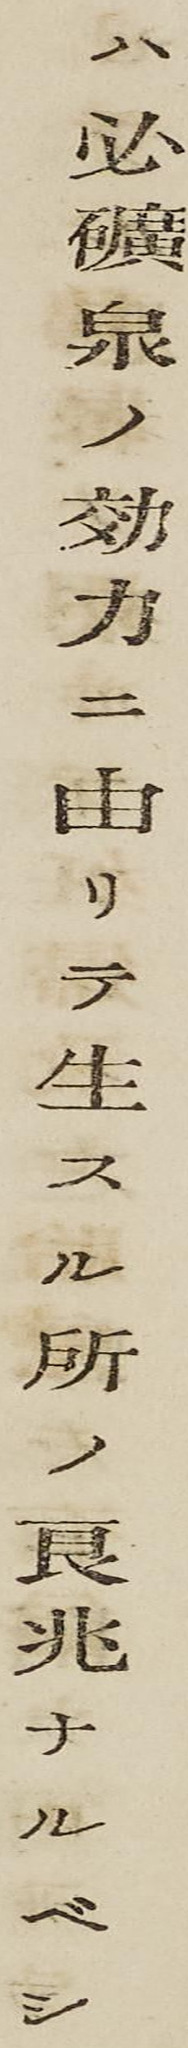ハ必礦泉ノ効力ニ由リテ生スル所ノ良兆ナルベシ
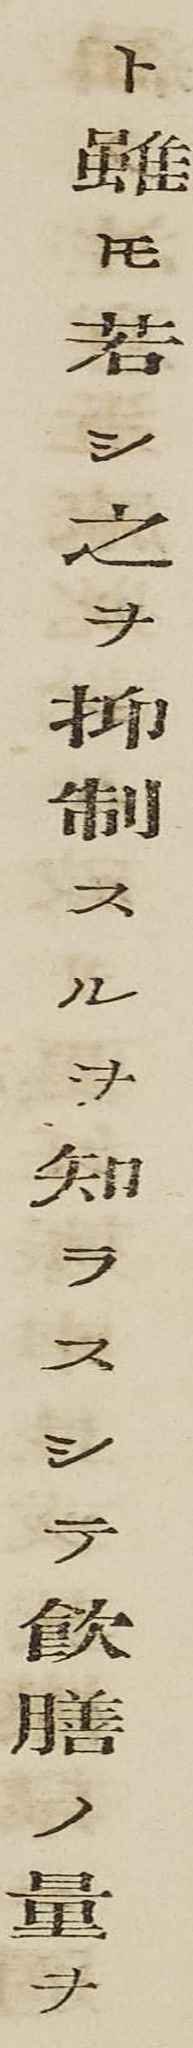ト雖トモ若シ之ヲ抑制スルヲ知ラスシテ飲膳ノ量ヲ
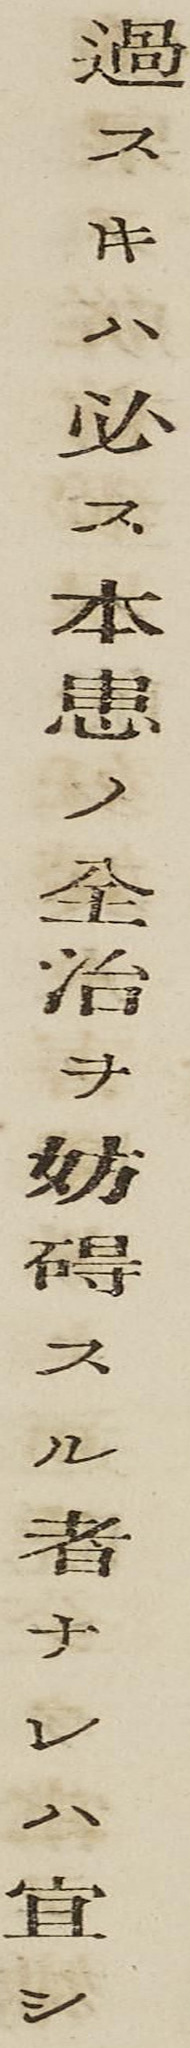過ストキハ必ス本患ノ全治ヲ妨碍スル者ナレハ宣シ
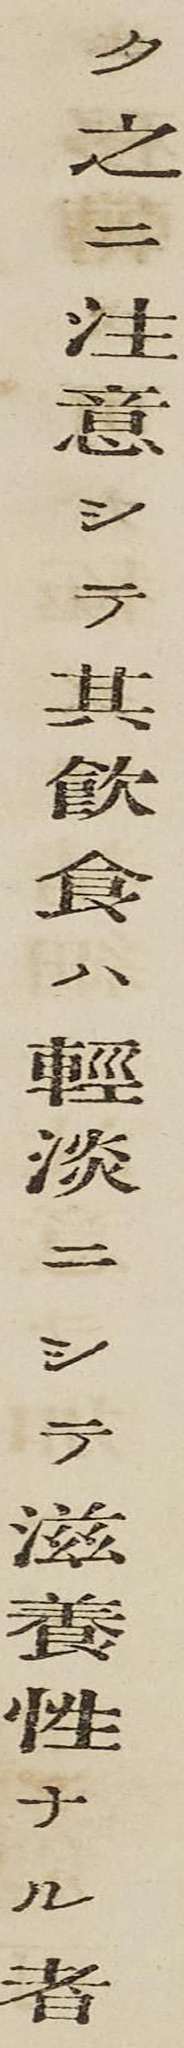ク之ニ注意シテ其飲食ハ軽淡ニシテ滋養性ナル者
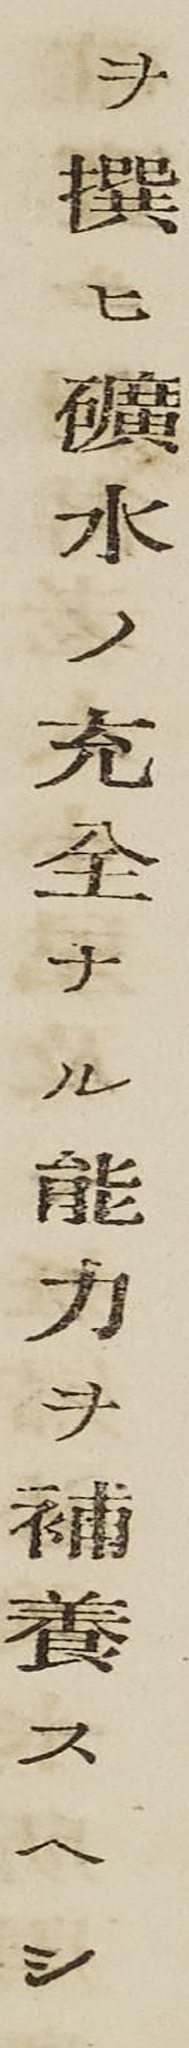ヲ撰ヒ礦水ノ充全ナル能力ヲ補養スヘシ
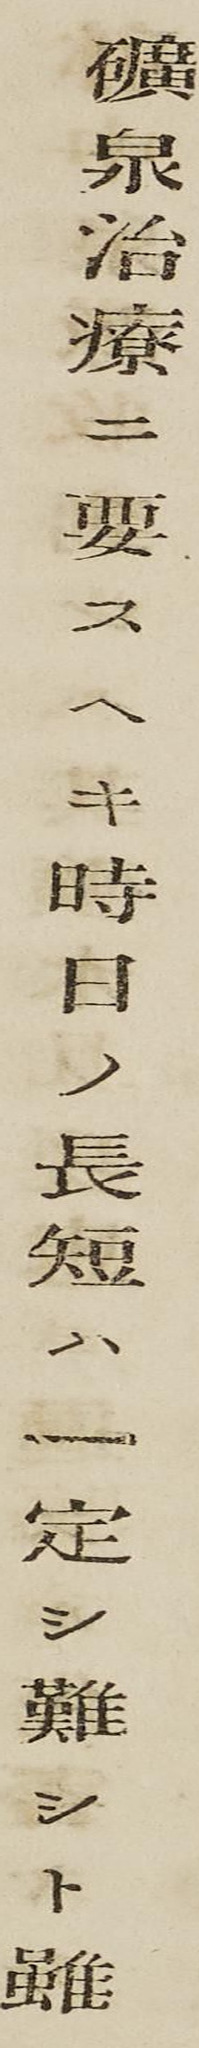礦泉治療ニ要スヘキ時日ノ長短ハ一定シ難シト雖
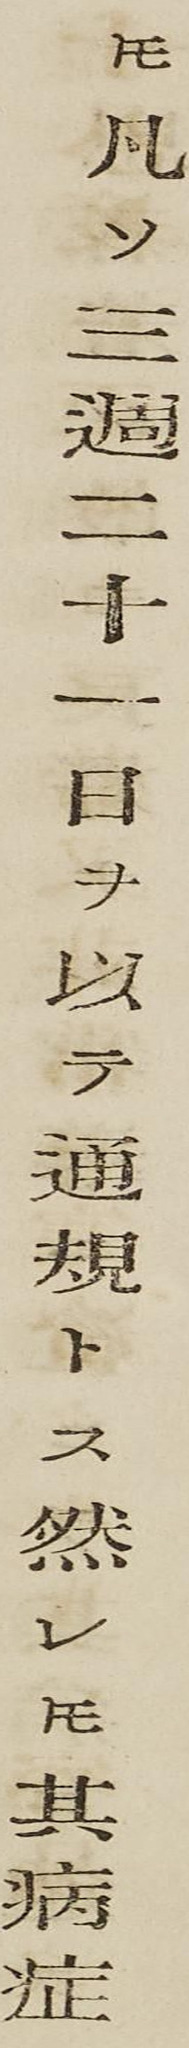トモ凡ソ三週二十一日ヲ以テ通規トス然レトモ其病症
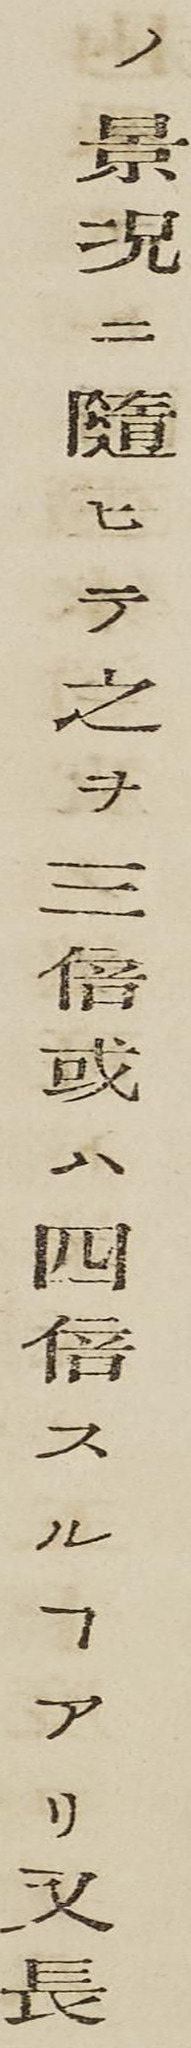ノ景況ニ随ヒテ之ヲ三倍或ハ四倍スルコトアリ又長
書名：日本温泉考
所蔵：東京大学地震研究所図書室 Earthquake Research Institute Library, The University of Tokyo, JAPAN
